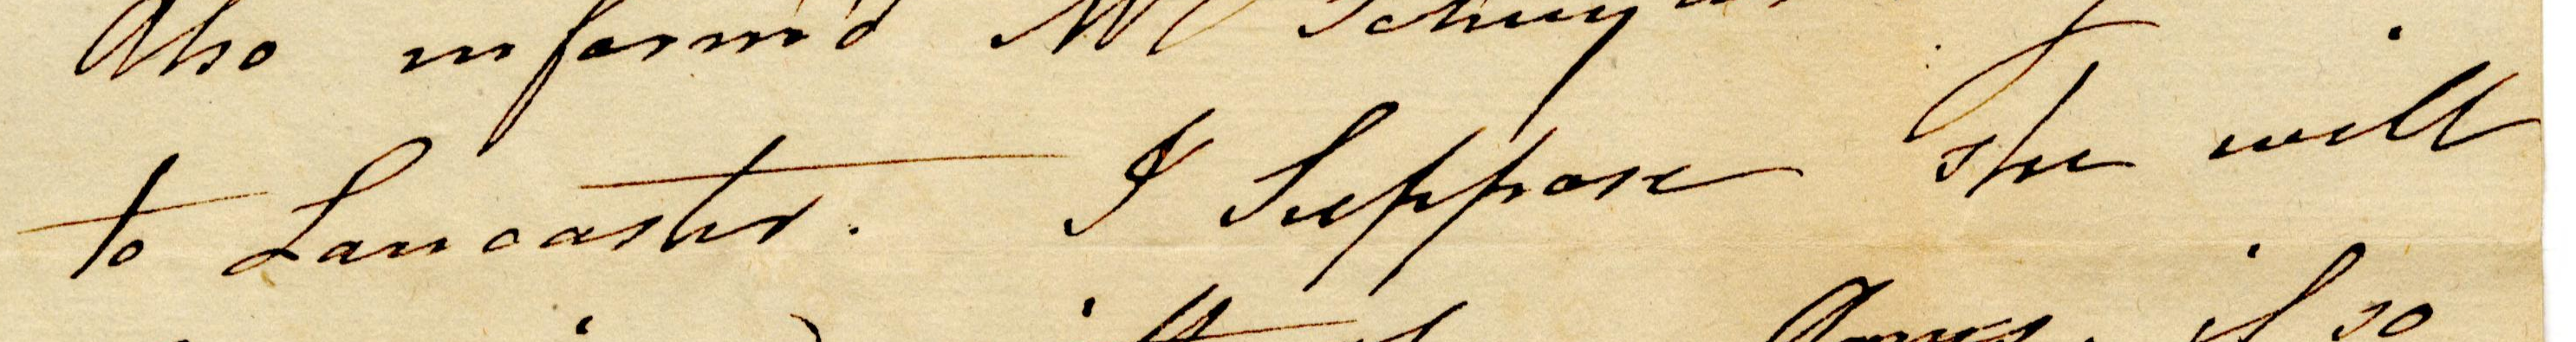to Lancaster. I Suppose she will
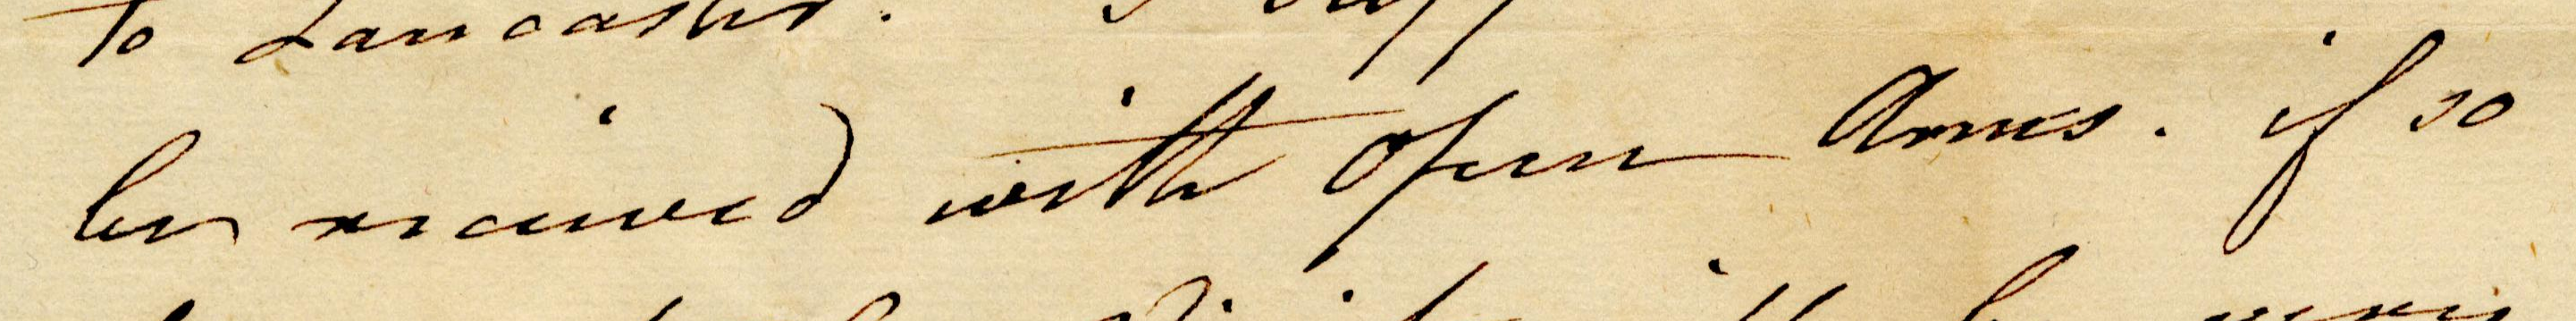be received with open Arms. if so
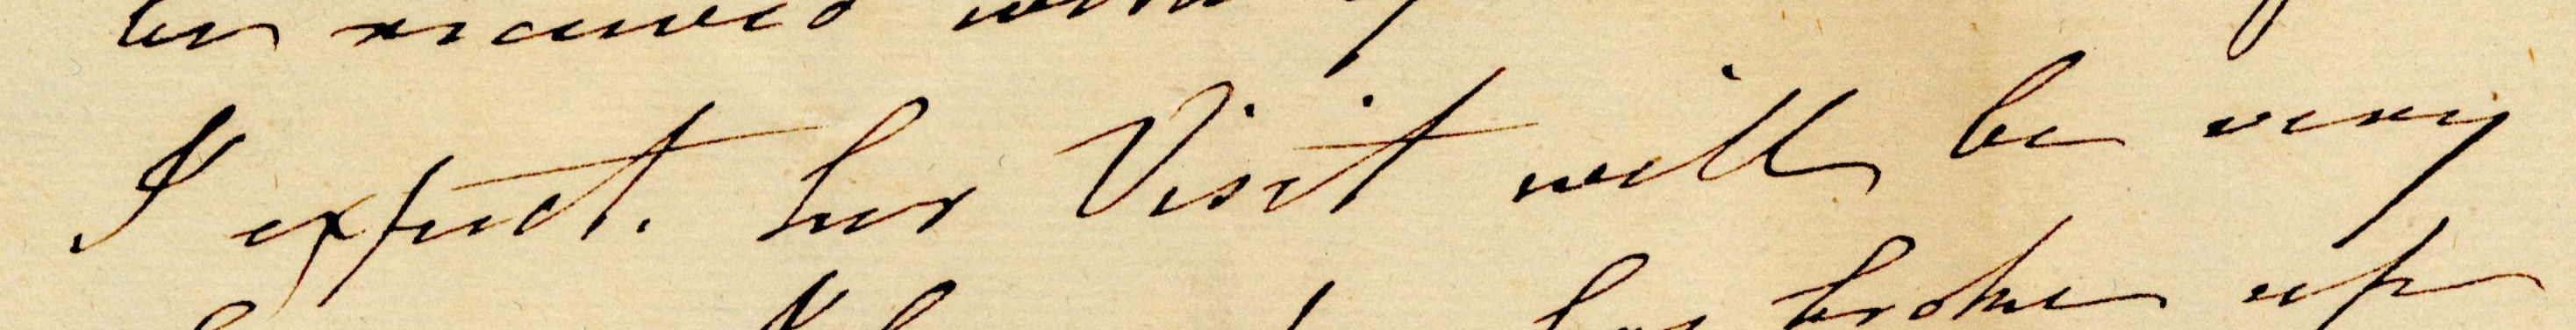I expect her Visit will be very
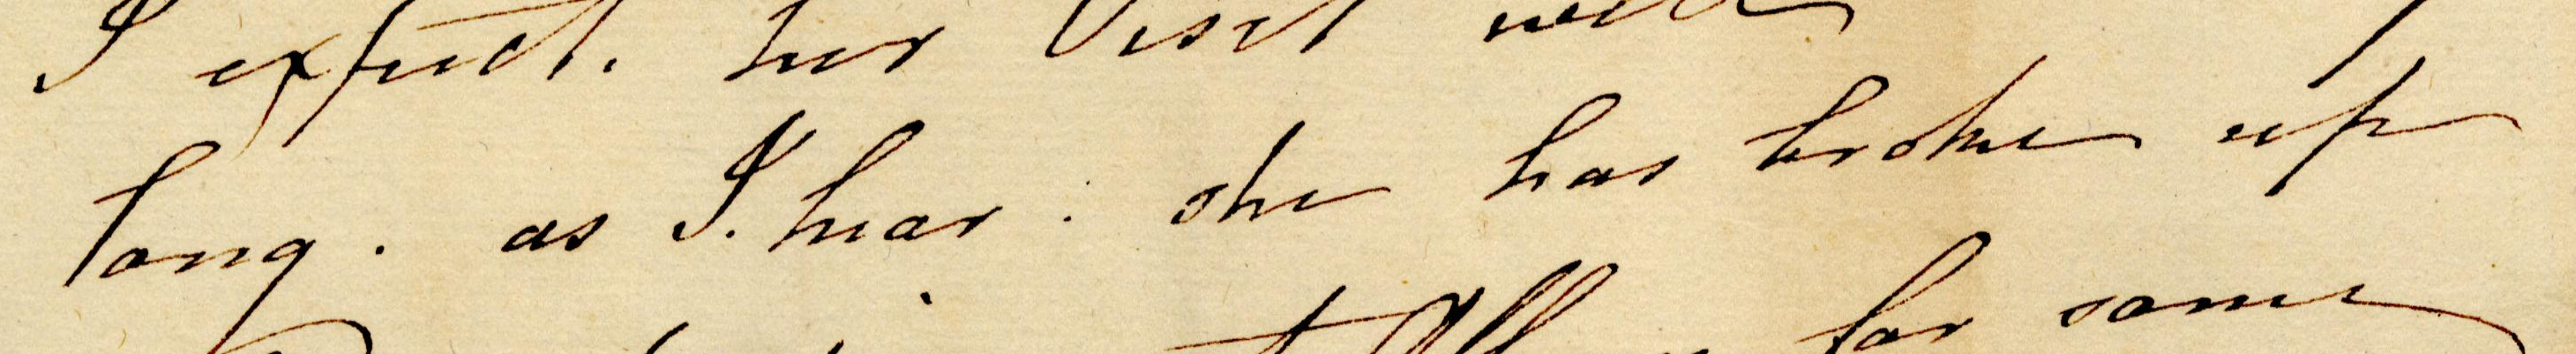long. as I hear she has broke up
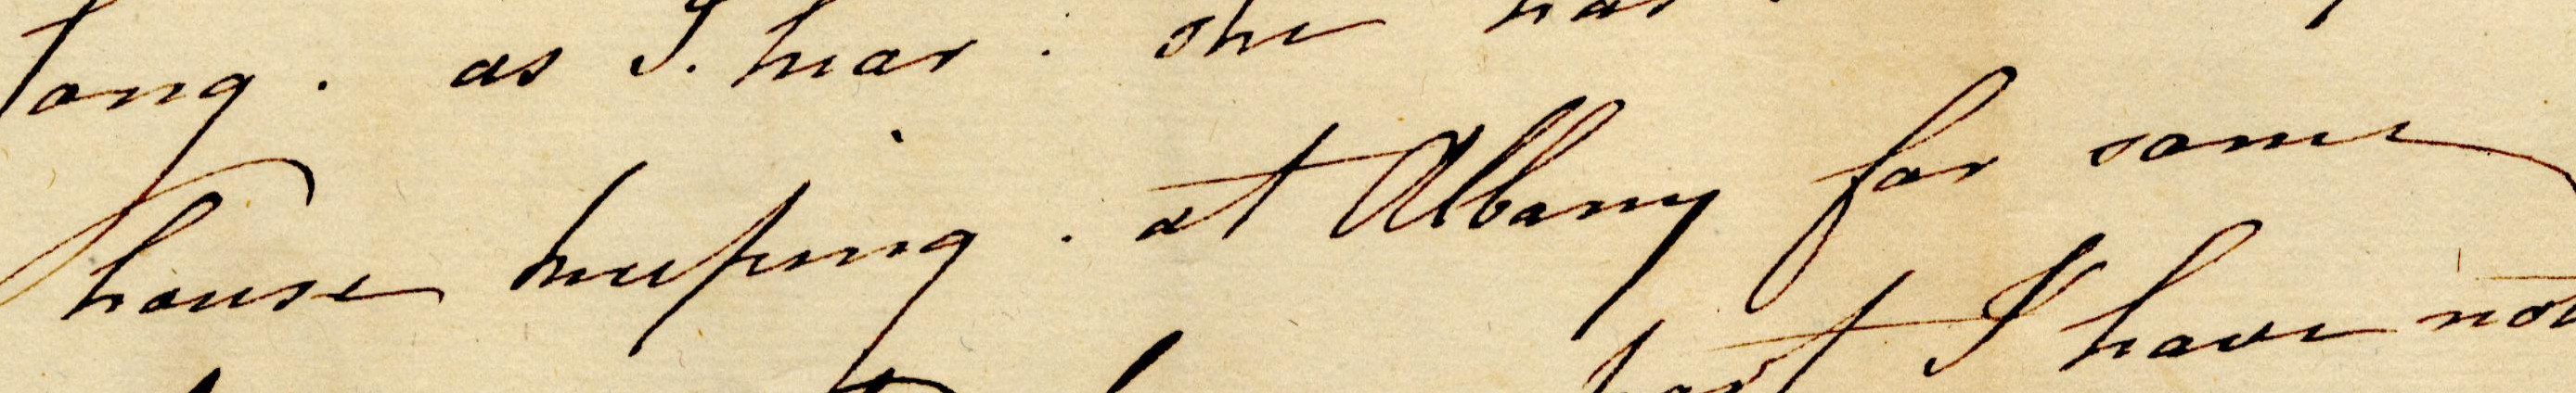house hunting at Albany for some
